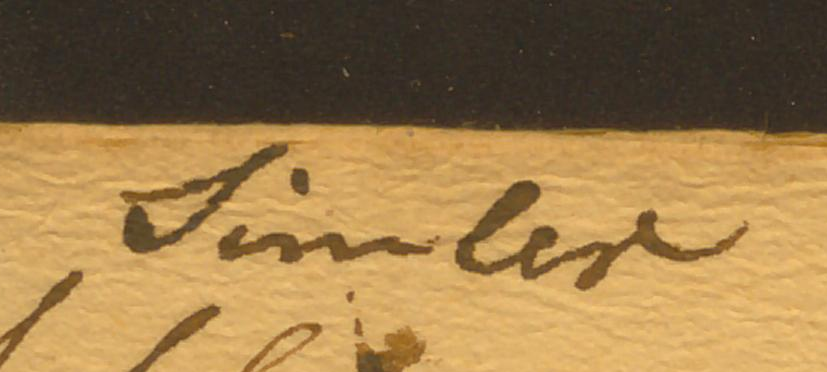Simler
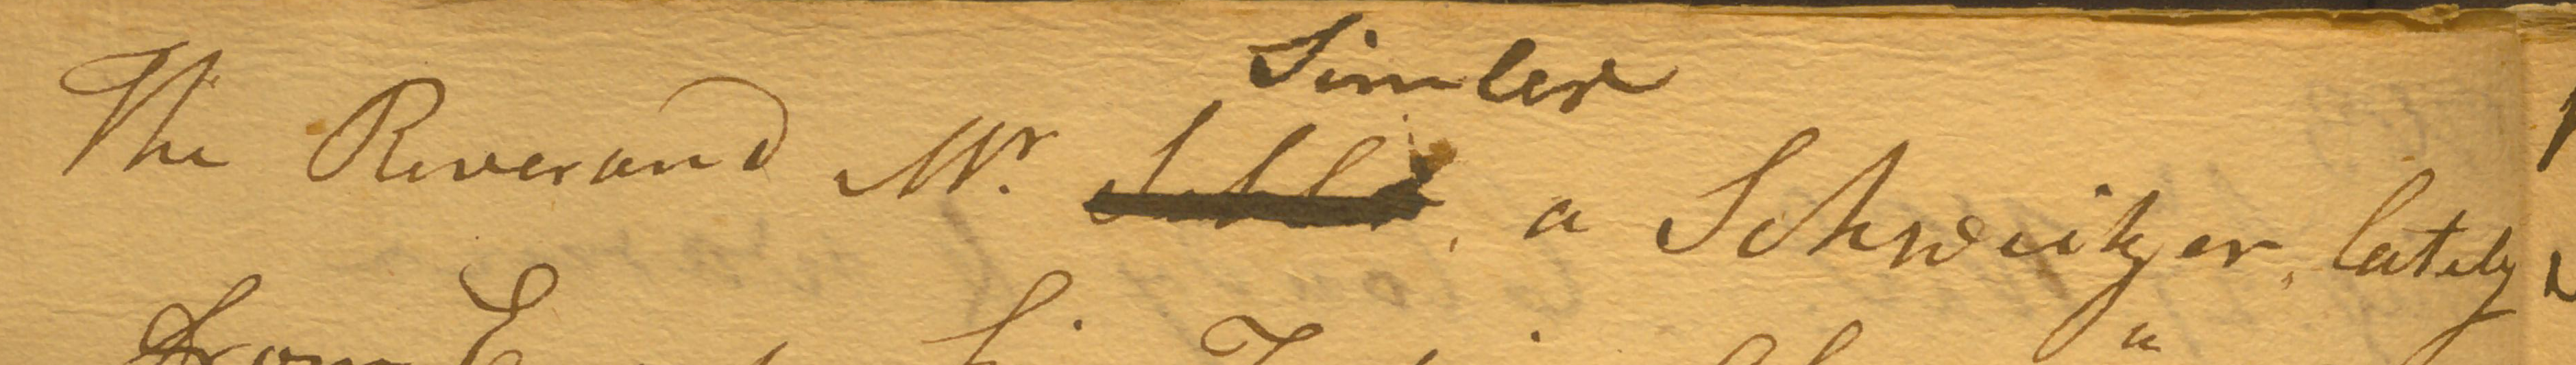The Reverand M^r. [______] a Schweitzer lately
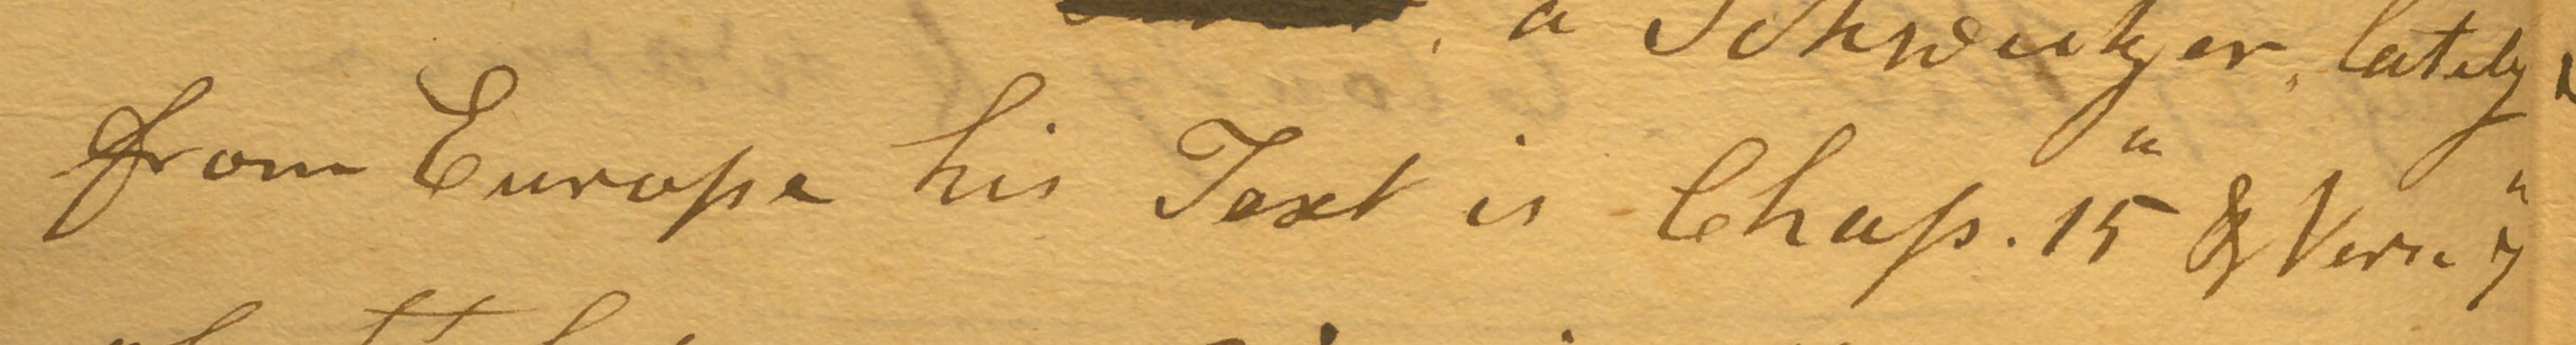from Europe his Text is Chap. 15^th & Verse 7
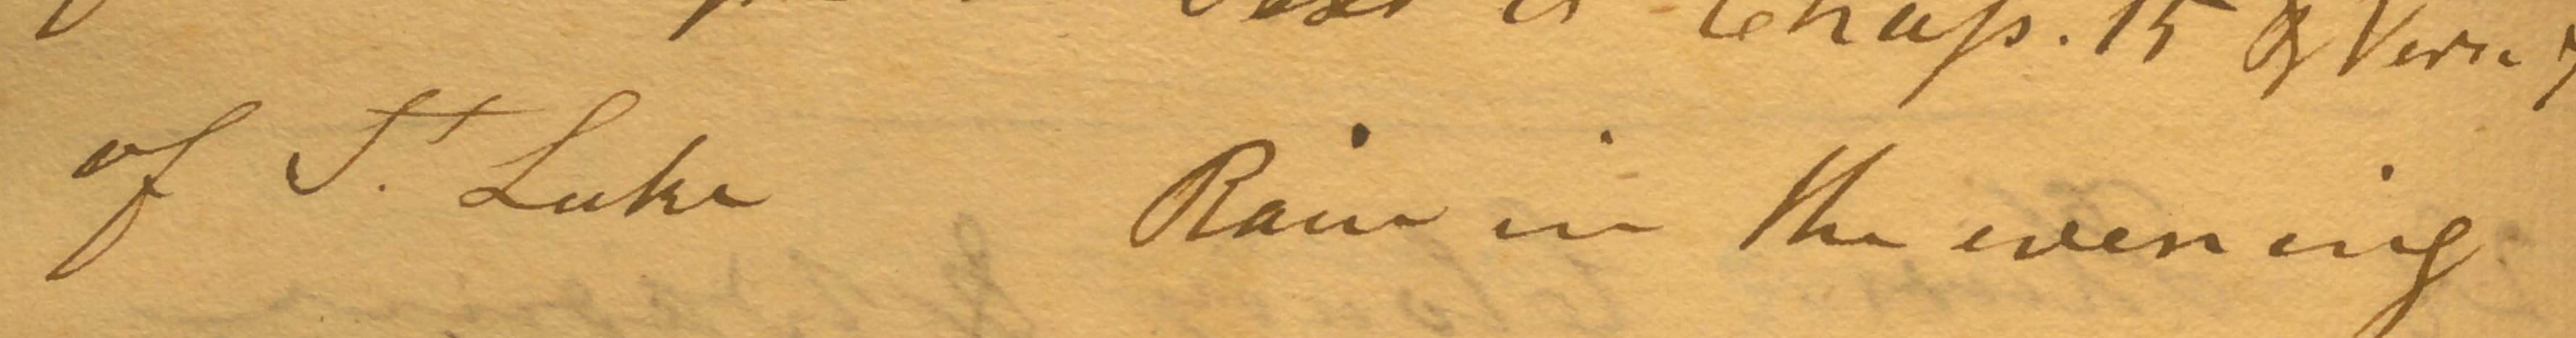of S^t. Luke Rain in the evening
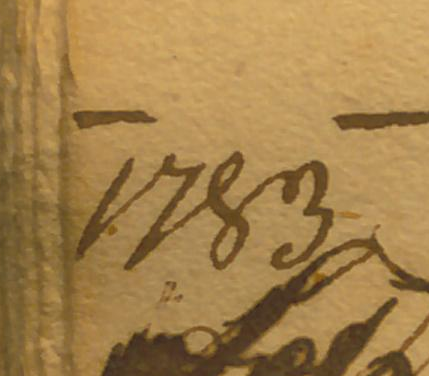1783
